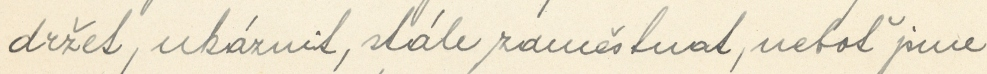držet, ukáznit, stále zaměstnat, neboť jsme
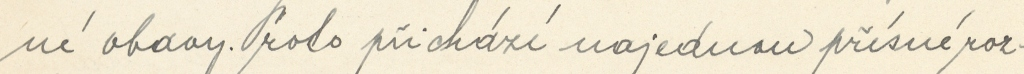né obavy. Proto přichází najednou přísné roz-
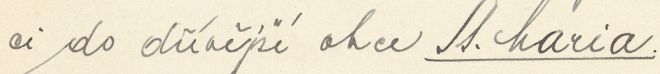ci do dřívější obce St. Maria.
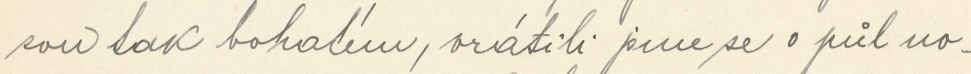sou tak bohatém, vrátili jsme se o půl no-
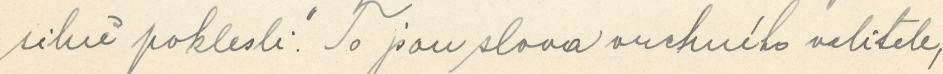silně poklesli. To jsou slova vrchního velitele,
